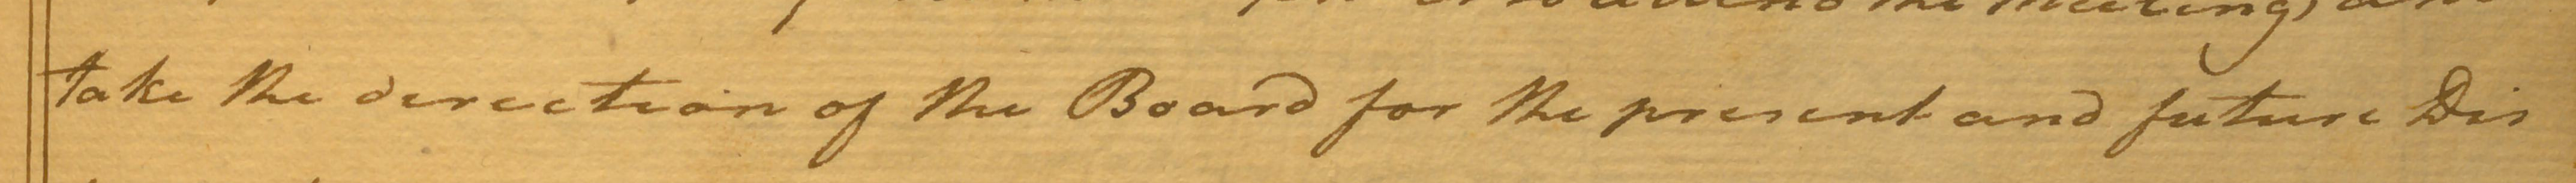take the direction of the Board for the present and future Dis
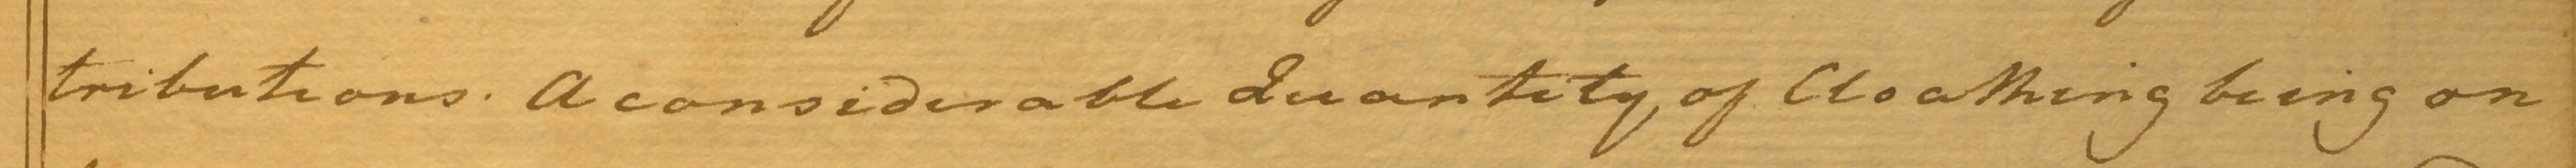tributions. A considerable Quantity of Cloathing being on
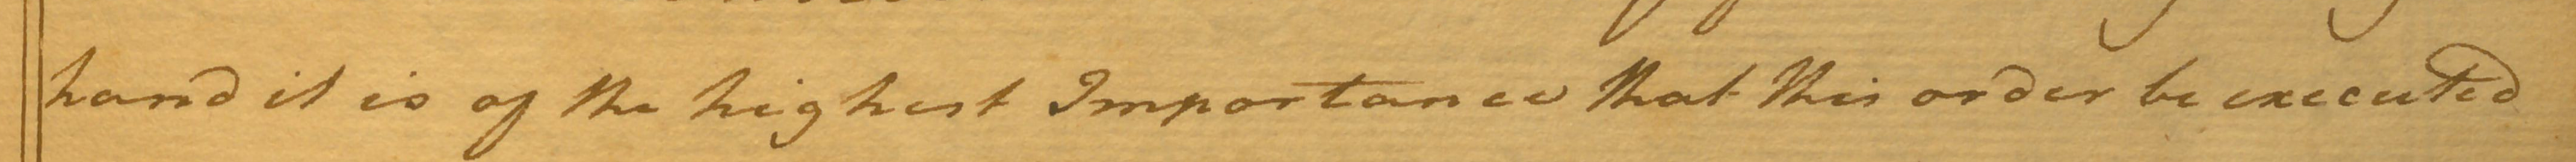hand it is of the highest Importance that this order be executed
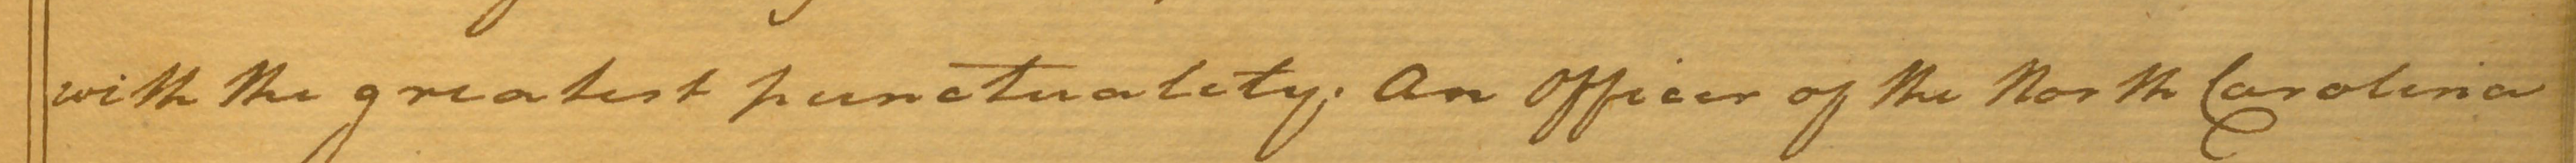with the greatest punctuality. An Officer of the North Carolina
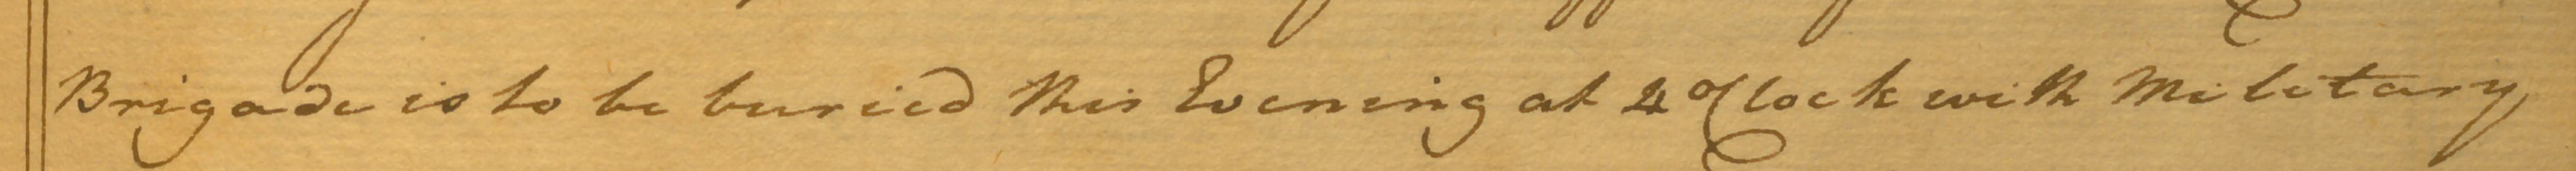Brigade is to be buried this Evening at 4 ^oClock with Military
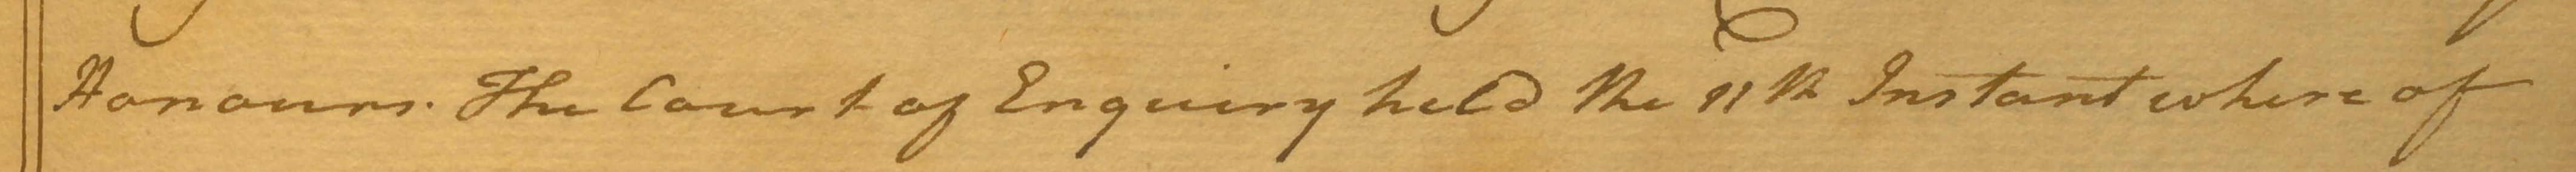Honours. The Court of Enquiry held the 11^th Instant where of
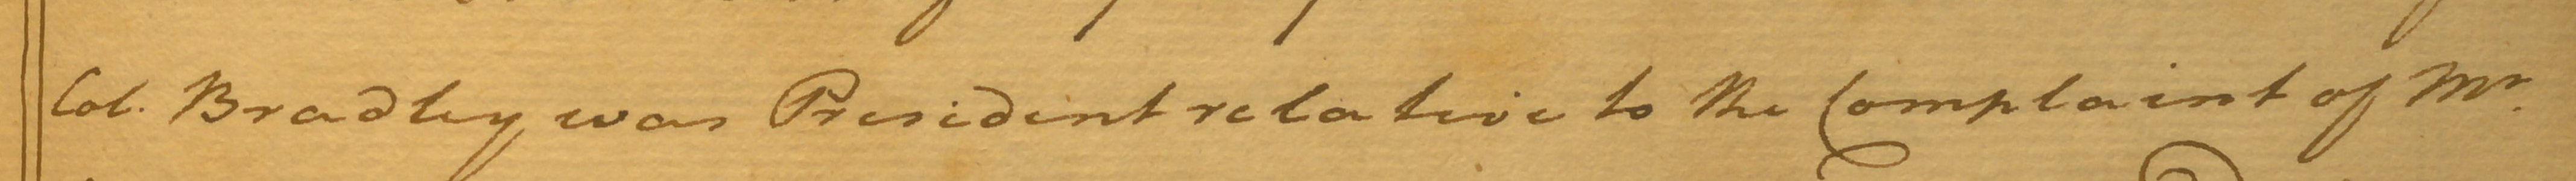Col. Bradley was President relative to the Complaint of M^r.
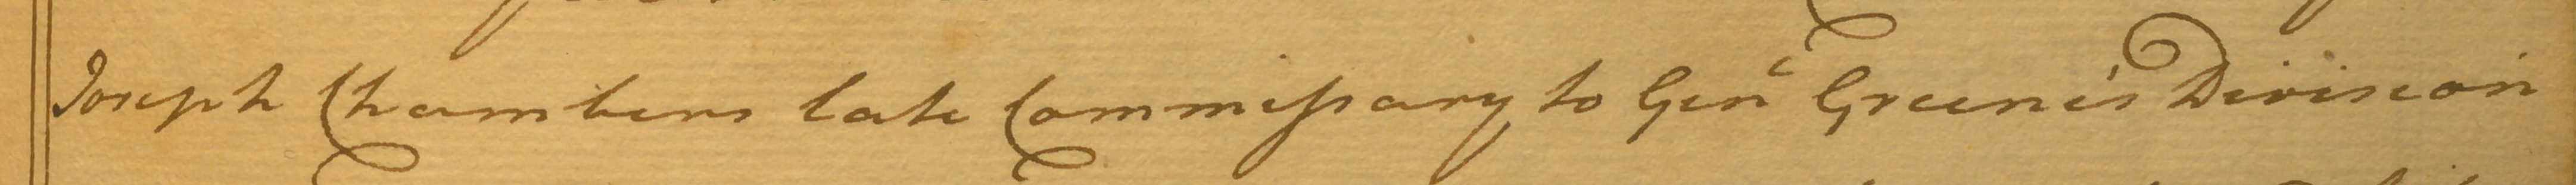Joseph Chambers late Commissary to Gen^l Greene's Division
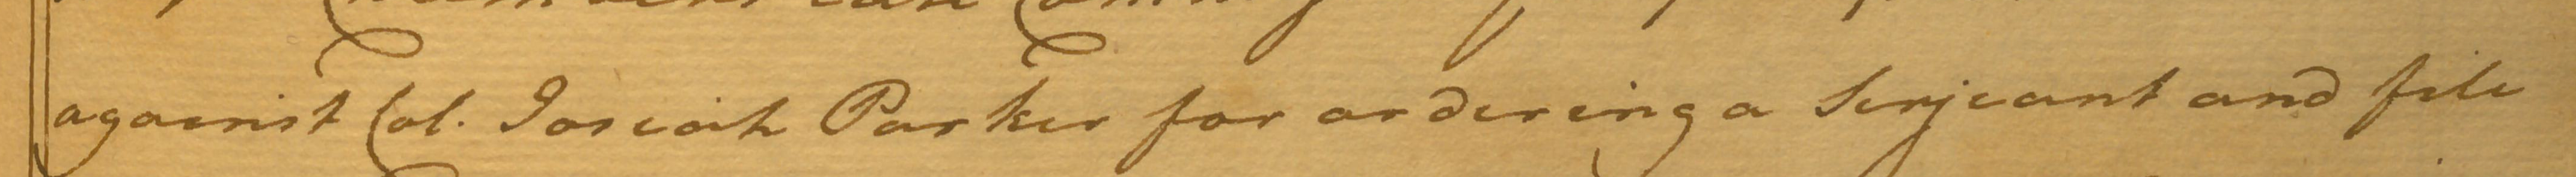against Col. Josiah Parker for ordering a Sergeant and file
